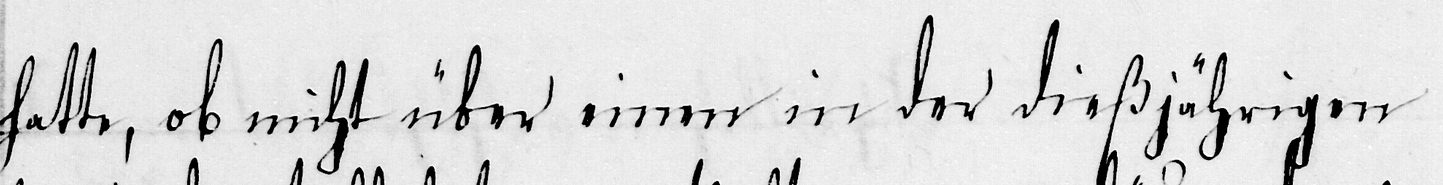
hatte, ob nicht über einen in der dießjährigen
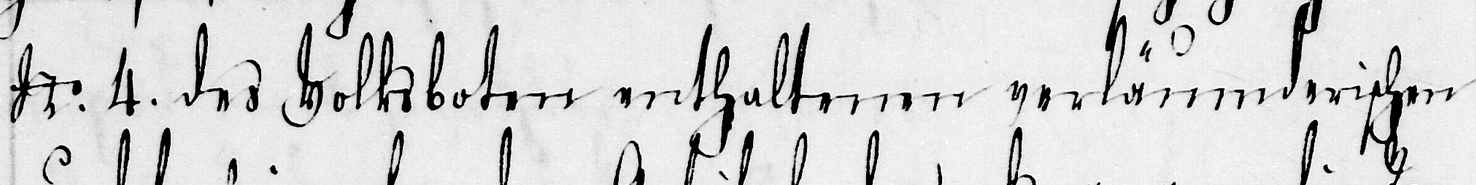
No. 4. des Volksboten enthaltenen verläumderischen
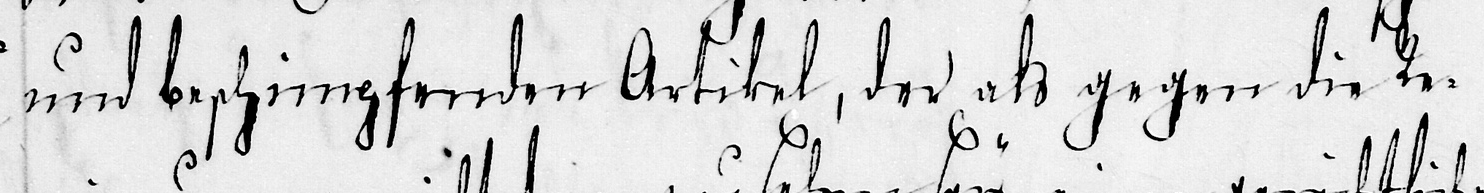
und beschimpfenden Artikel, der als gegen die Re¬
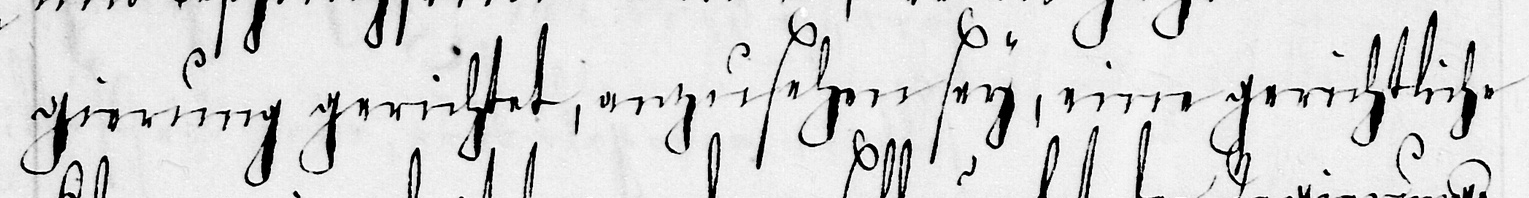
gierung gerichtet, anzusehen sey, eine gerichtliche
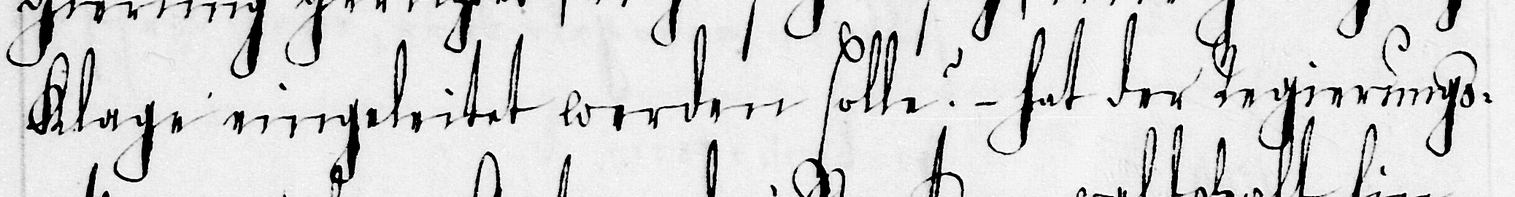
Klage eingeleitet werden solle? – hat der Regierungs¬
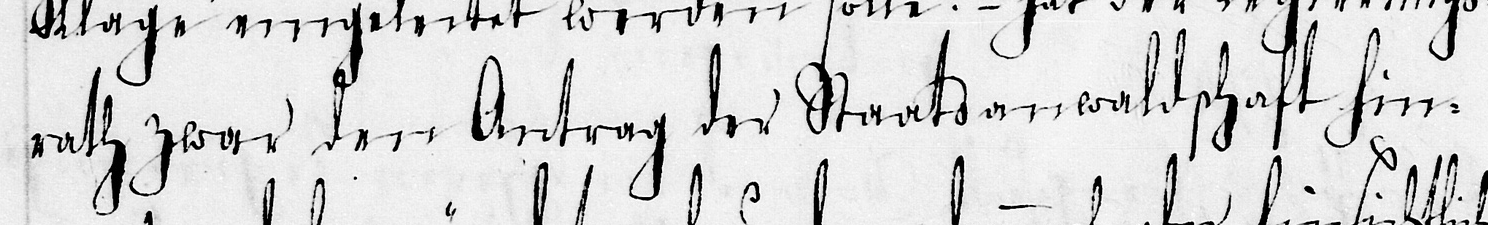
rath zwar den Antrag der Staatsanwaldschaft hin¬
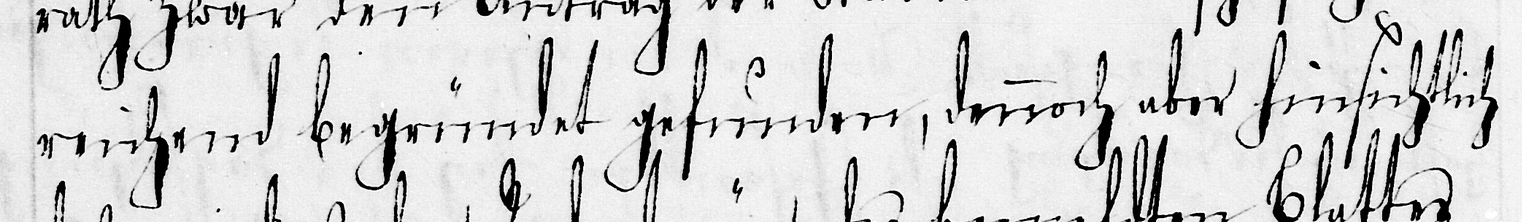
reichend begründet gefunden, dennoch aber hinsichtli¬
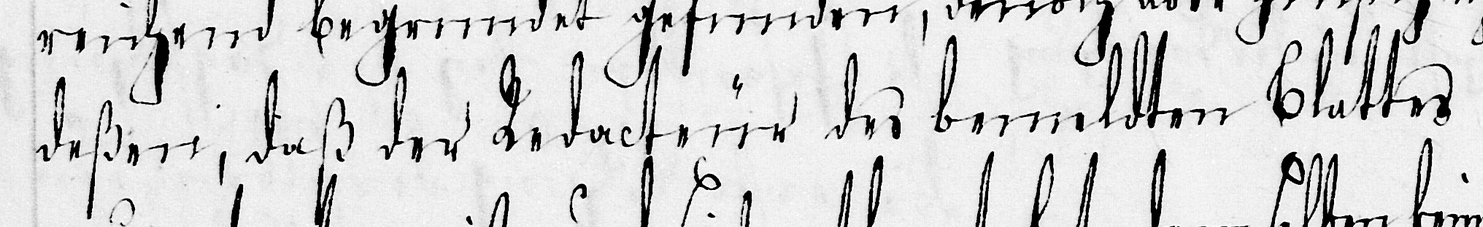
deßen, daß der Redacteur des bemeldten Blattes
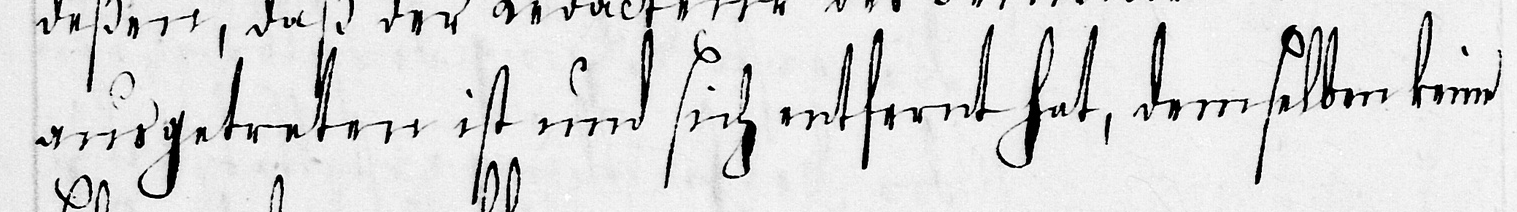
ausgetreten ist und sich entfernt hat, demselben
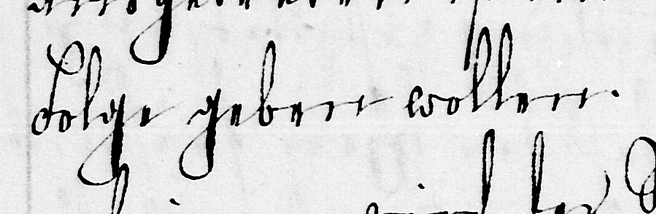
Folge geben wollen.
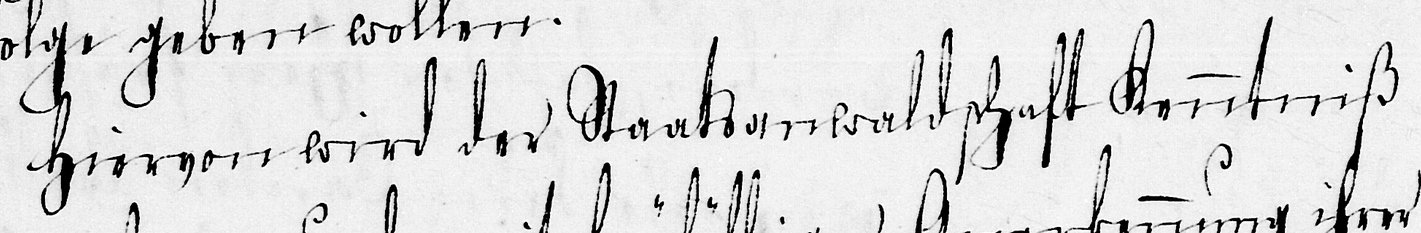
Hiervon wird der Staatsanwaldschaft Kenntniß
